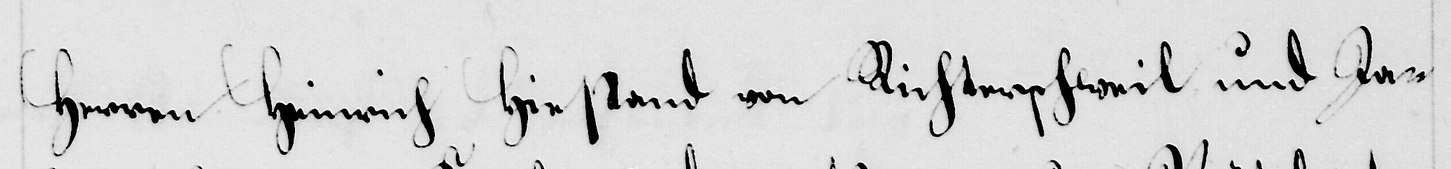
Herren Heinrich Hiestand von Richterschweil und Ja¬
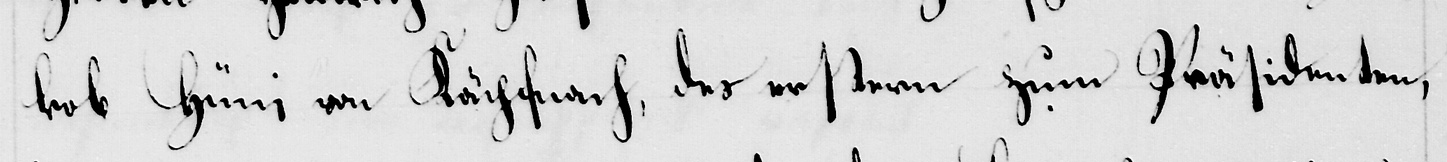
cob Hüni von Käpfnach, des erstern zum Präsidenten,
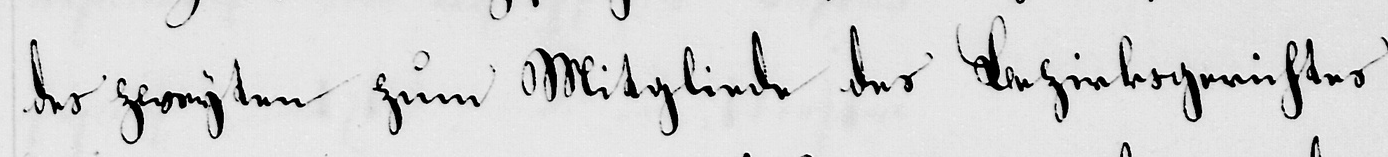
des zweyten zum Mitgliede des Bezirksgerichtes
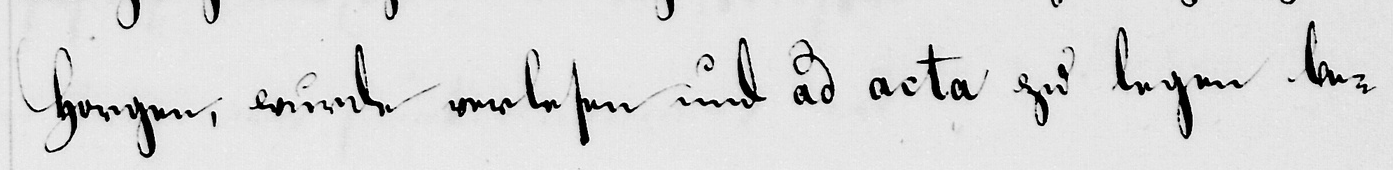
Horgen, wurde verlesen und ad acta zu legen be¬
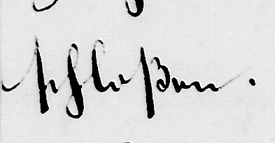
schloßen.
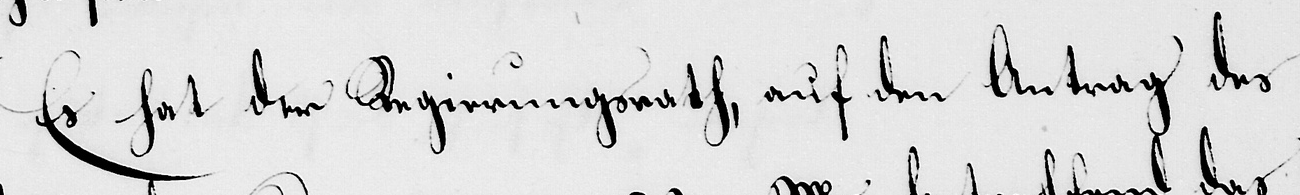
Es hat der Regierungsrath auf den Antrag des
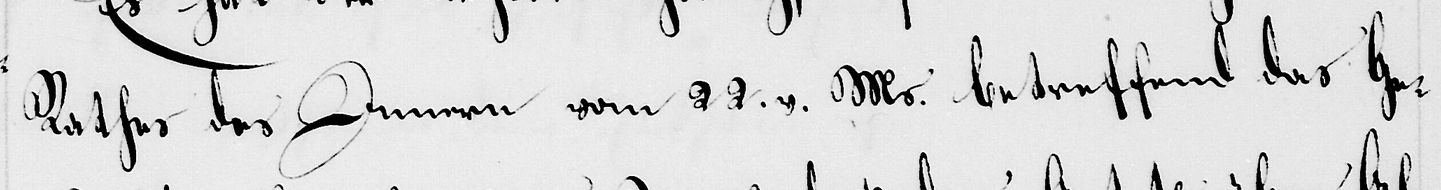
Rathes des Innern vom 22. v. Ms. betreffend des Ge¬
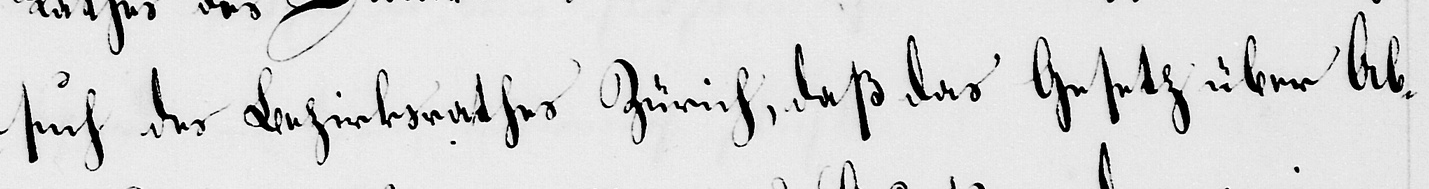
such des Bezirksrathes Zürich, daß das Gesetz über Ab¬
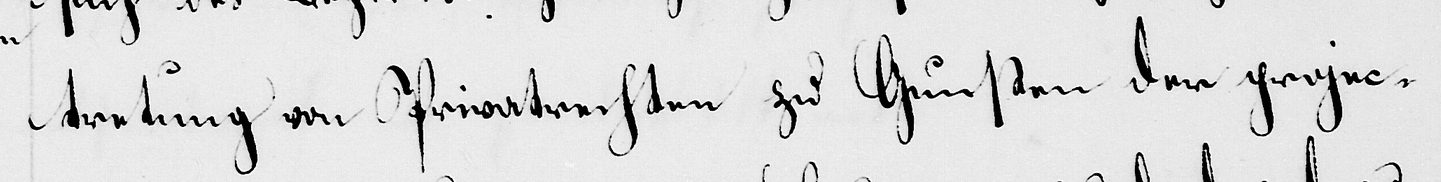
tretung von Privatrechten zu Gunsten der proje¬
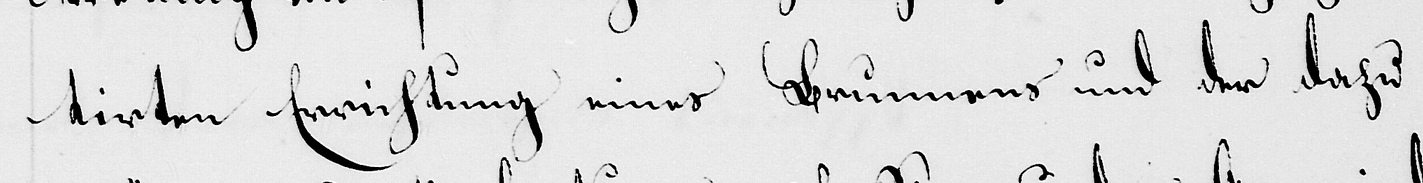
ctirten Errichtung eines Brunnens und der dazu
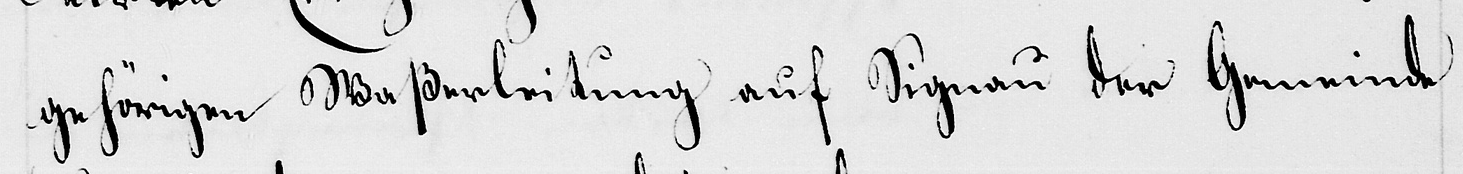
gehörigen Waßerleitung auf Signau der Gemeinde
